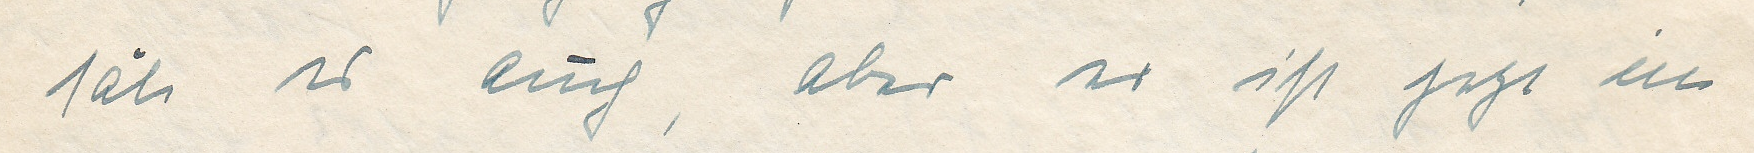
täte es auch, aber er ist jetzt im
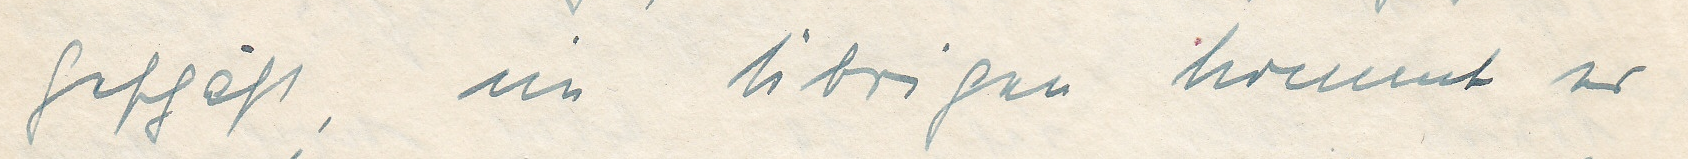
Geschäft, im Übrigen kommt er
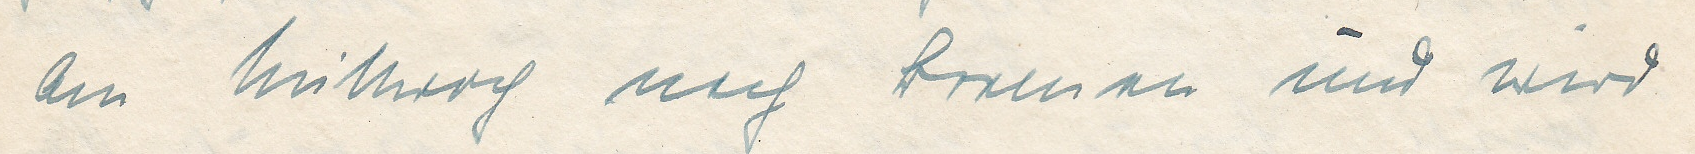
am Mittwoch nach Bremen und wird
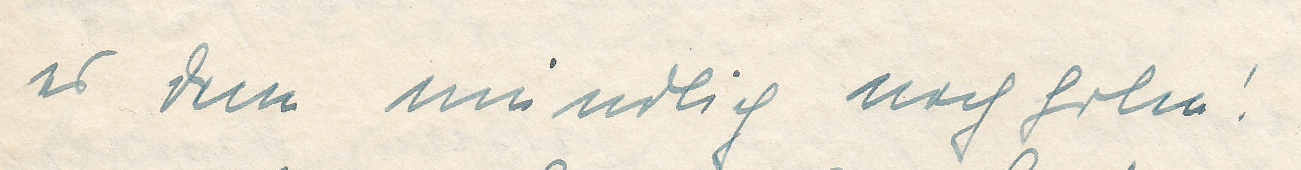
es den nun endlich nach Berlin!
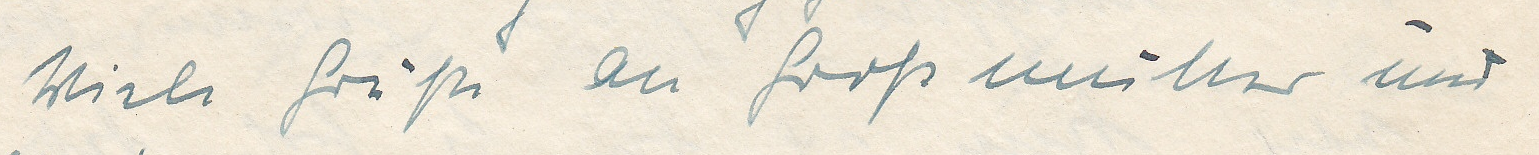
Viele Grüße an Großmutter und
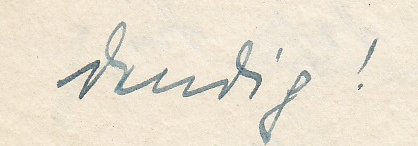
dundig!
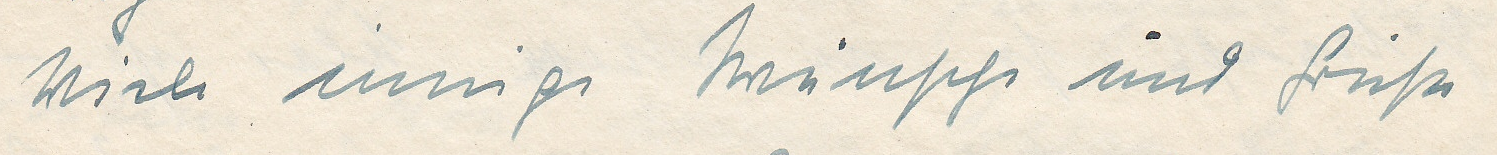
Viele innige Wünsche und Grüße
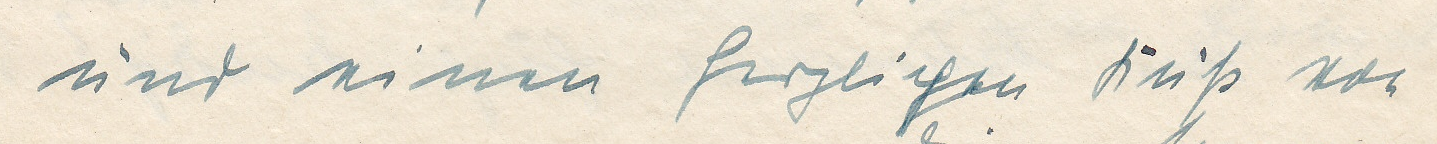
und einen herzlichen Kuß von
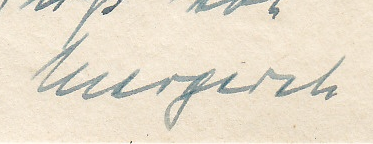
Margarete
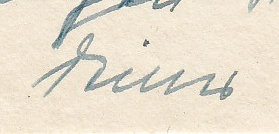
Deiner
